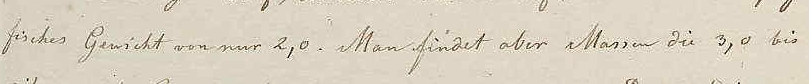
fisches Gewicht von nur 2,0. Man findet aber Massen die 3,0 bis
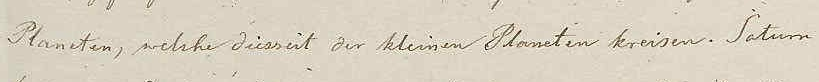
Planeten, welche diesseit der kleinen Planeten kreisen. Saturn
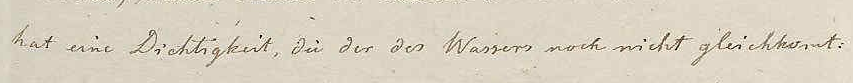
hat eine Dichtigkeit, die der des Wassers noch nicht gleichkomt:
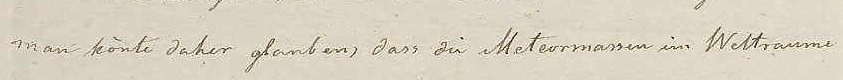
man könte daher glauben, dass die Meteormassen im Weltraume
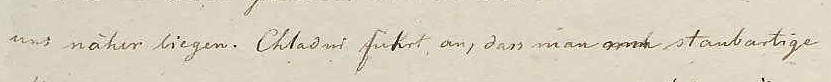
uns näher liegen. Chladni führt an, dass man auch staubartige
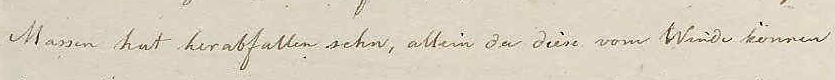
Massen hat herabfallen sehn, allein da diese vom Winde können
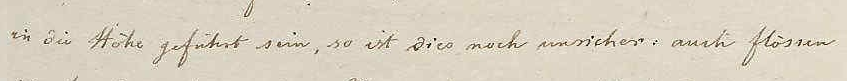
in die Höhe geführt sein, so ist dies noch unsicher: auch flössen
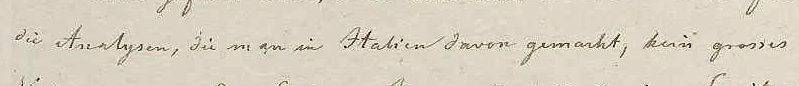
die Analysen, die man in Italien davon gemacht, kein grosses
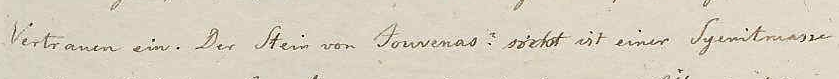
Vertrauen ein. Der Stein von Jouvenas ? sieht ist einer Syenitmasse
